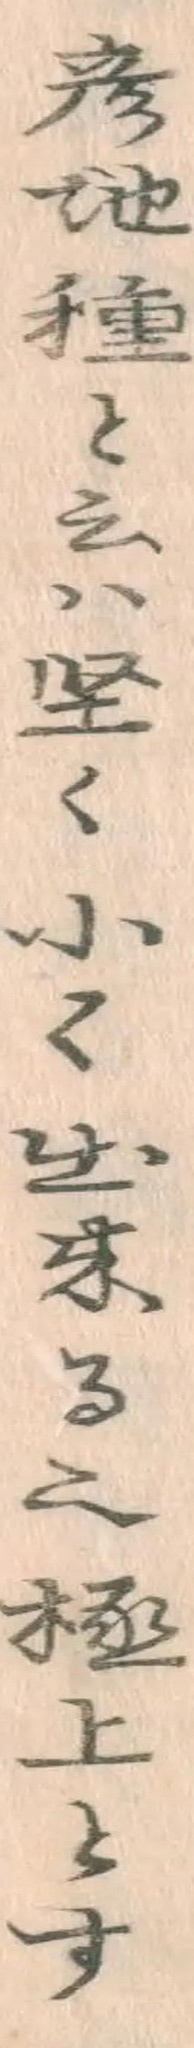彦地種と云は堅く小く出来る也極上とす
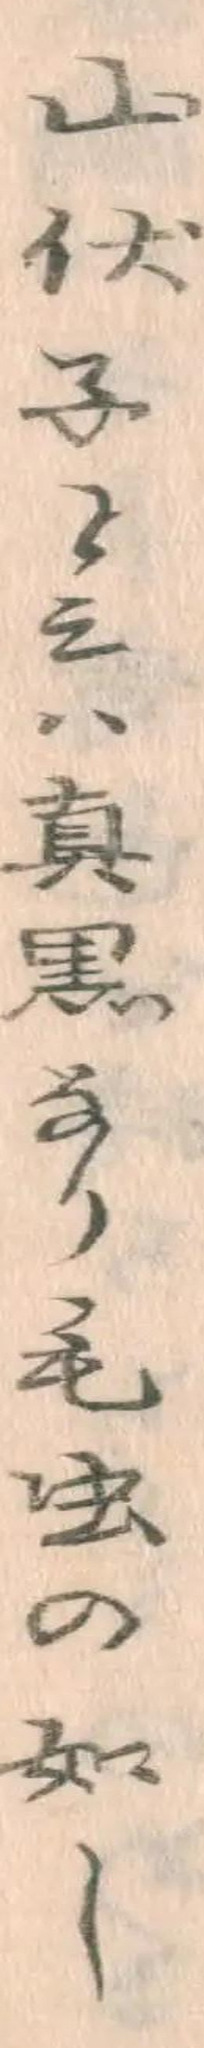山伏子と云は真黒なり毛虫の如し
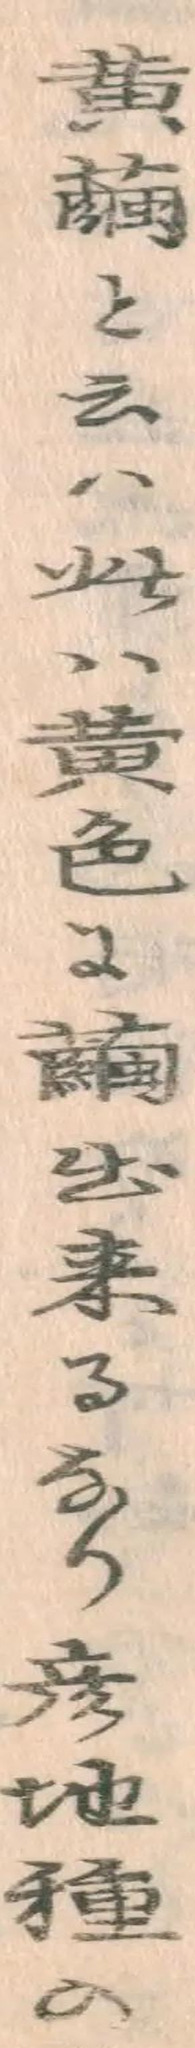黄繭と云は此は黄色に繭出来るなり彦地種の
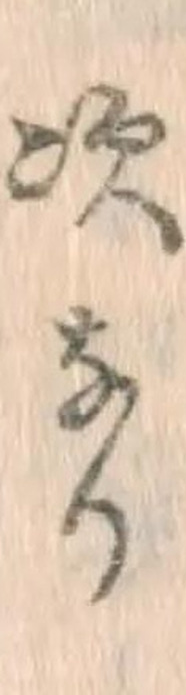次なり
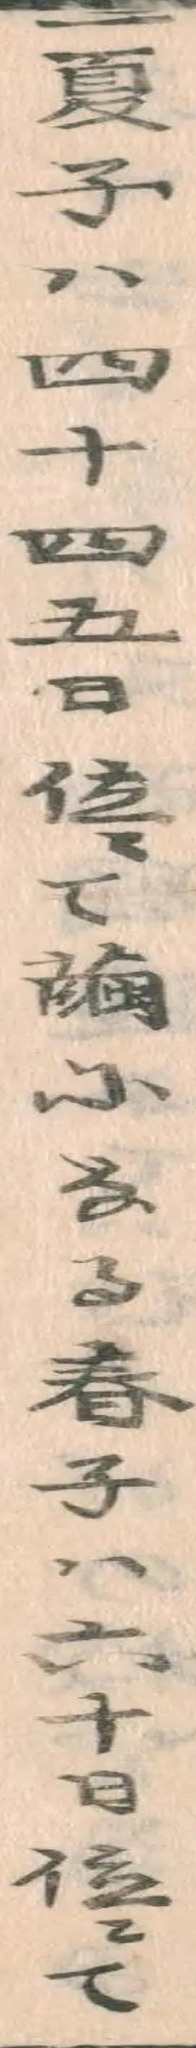一夏子は四十四五日位にて繭になる春子は六十日位にて
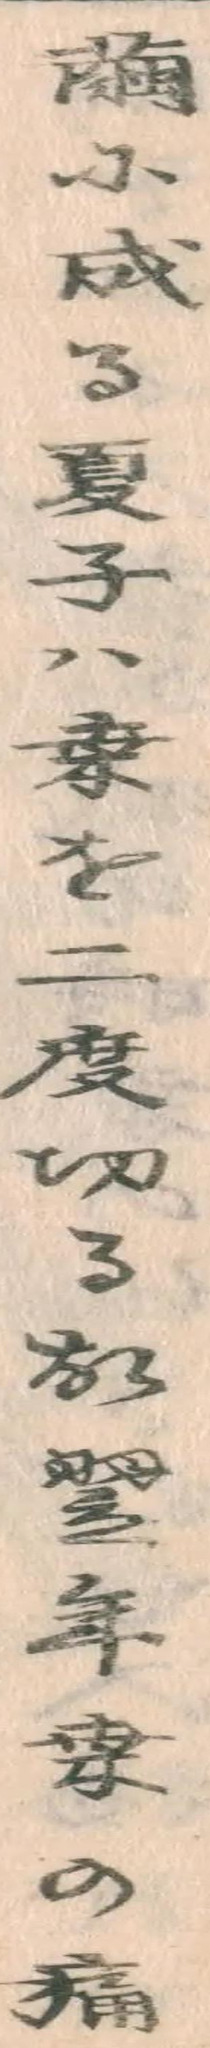繭に成る夏子は桑を二度切る故翌年桑の痛
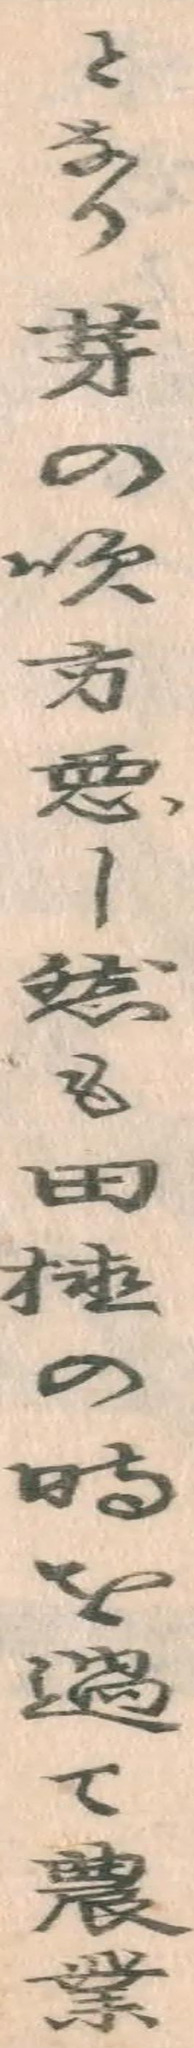となり芽の吹方悪し然も田植の時を過て農業
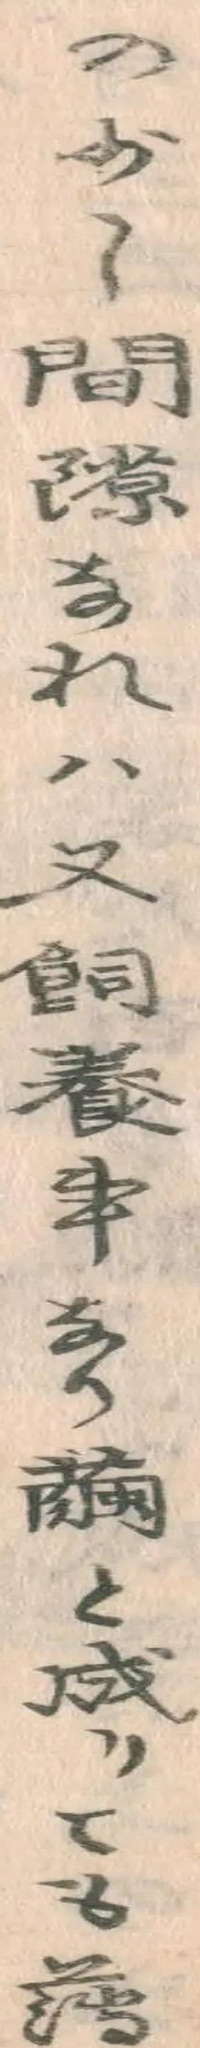の少し間隙なれは又飼養事なり繭と成りても薄
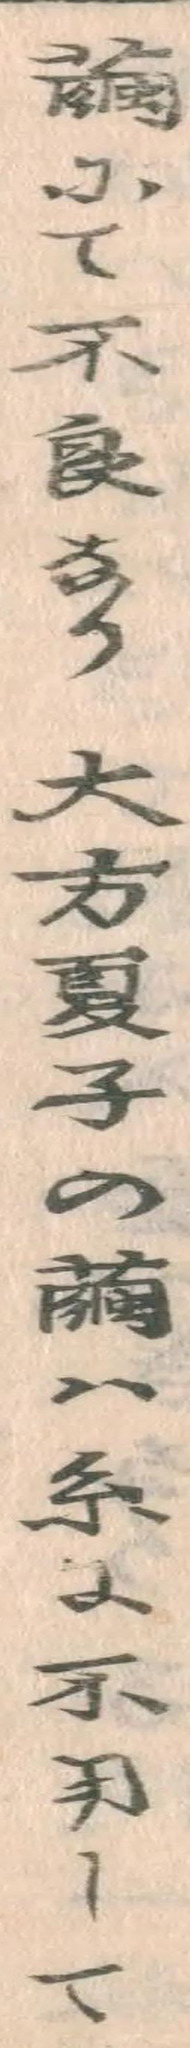繭にて不良なり大方夏子の繭は糸に不用して
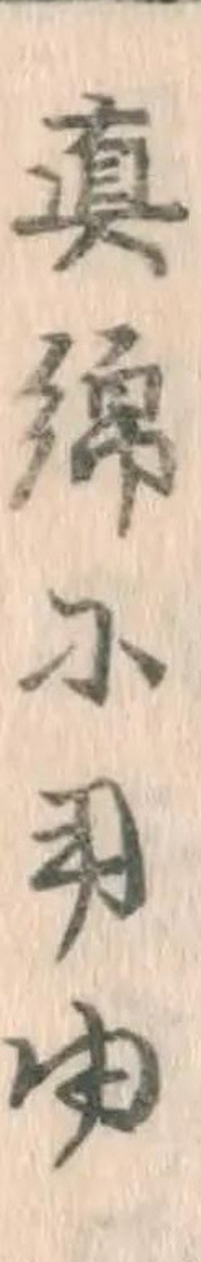真綿に用ゆ
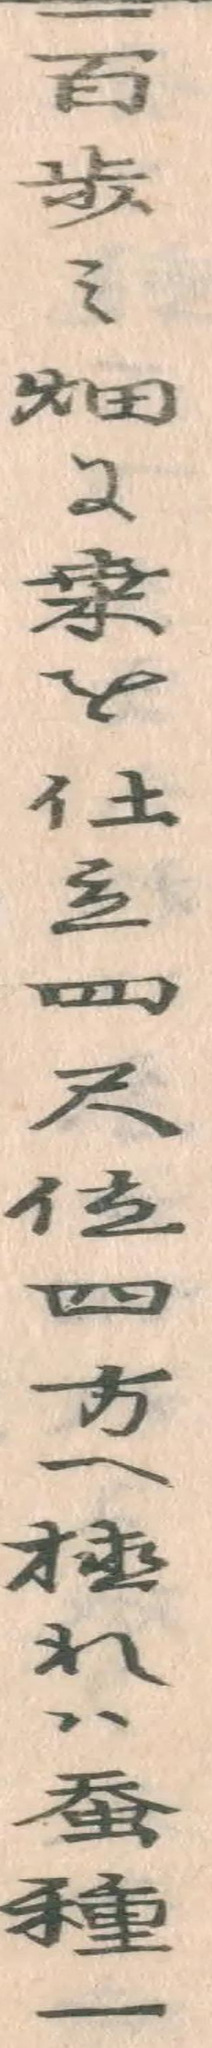一百歩之畑に桑を仕立四尺位四方へ植れは蚕種一
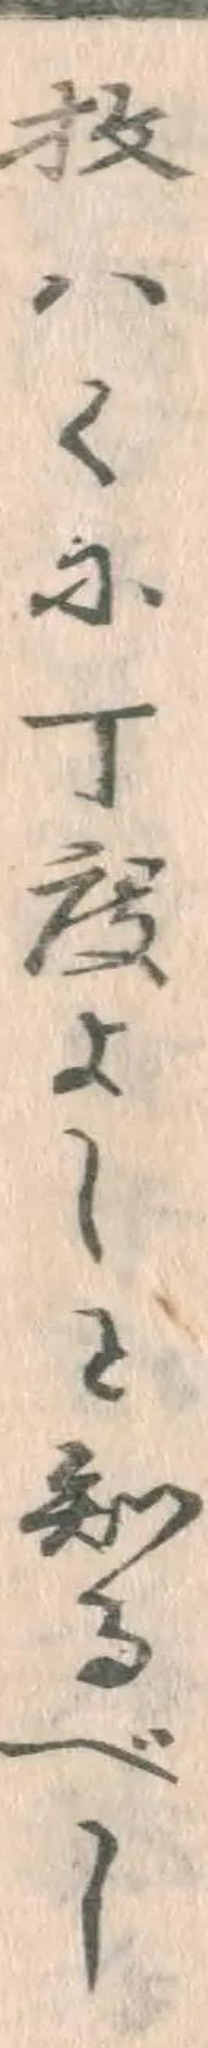枚はくに丁度よしと知るべし
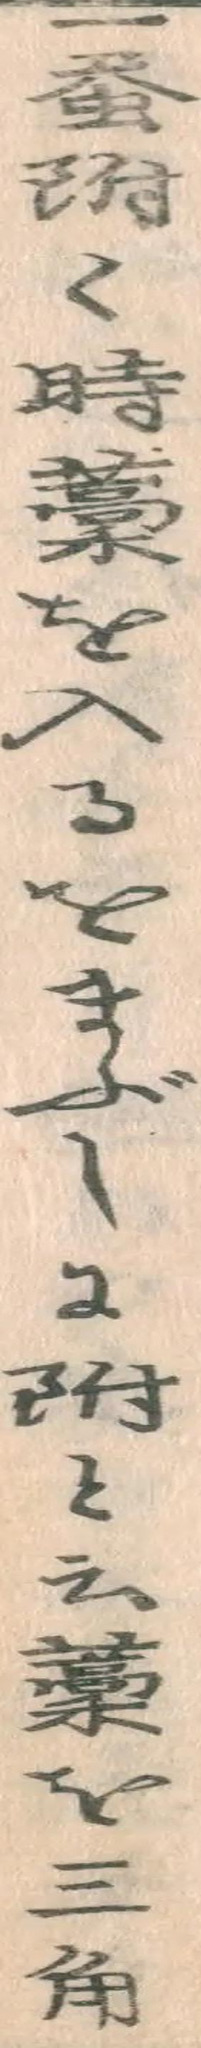一蚕附く時藁を入るをまぶしに附と云藁を三角
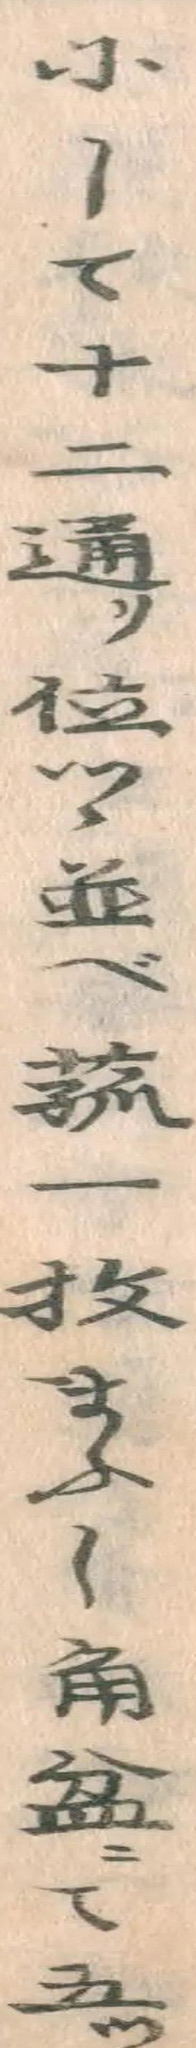にして十二通り位つゝ並べ菰一枚まふし角盆にて五ッ
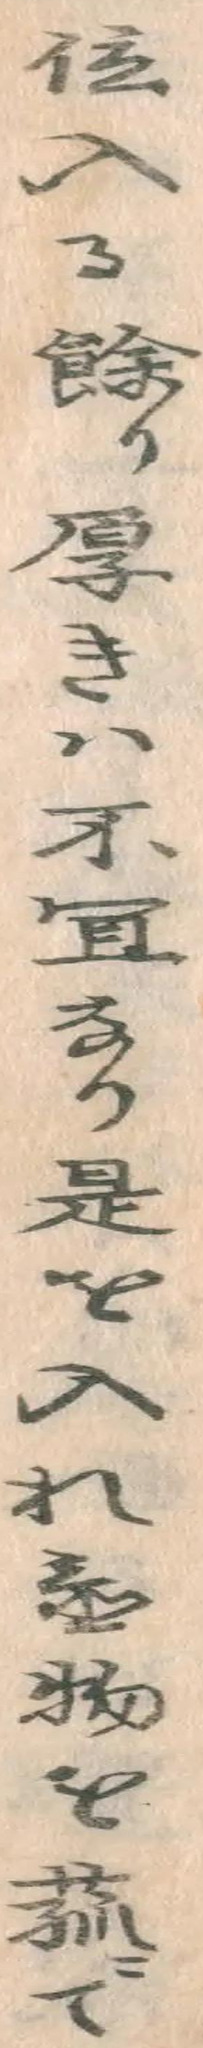位入る余り厚きは不宜なり是を入れ置物を菰にて
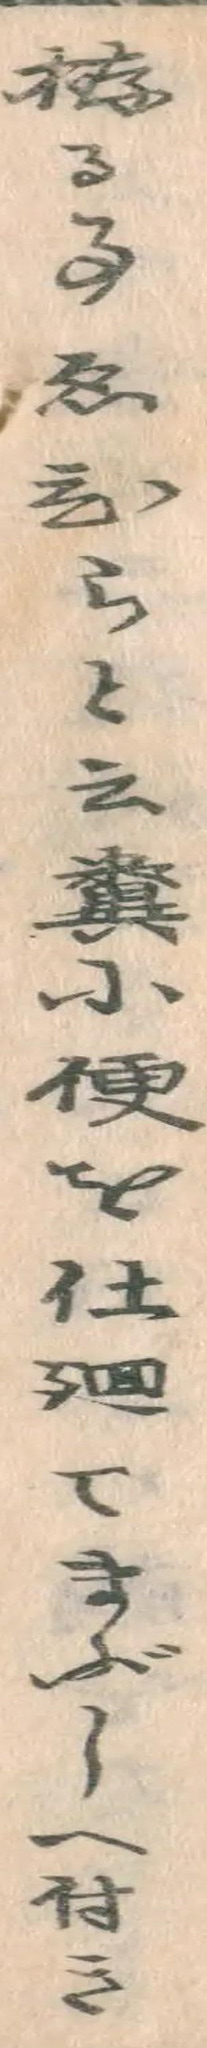拵る事ゑひらと云糞小便を仕廻てまぶしへ付き
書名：機織彙編 5巻. [1]
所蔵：国立国会図書館 National Diet Library, JAPAN
